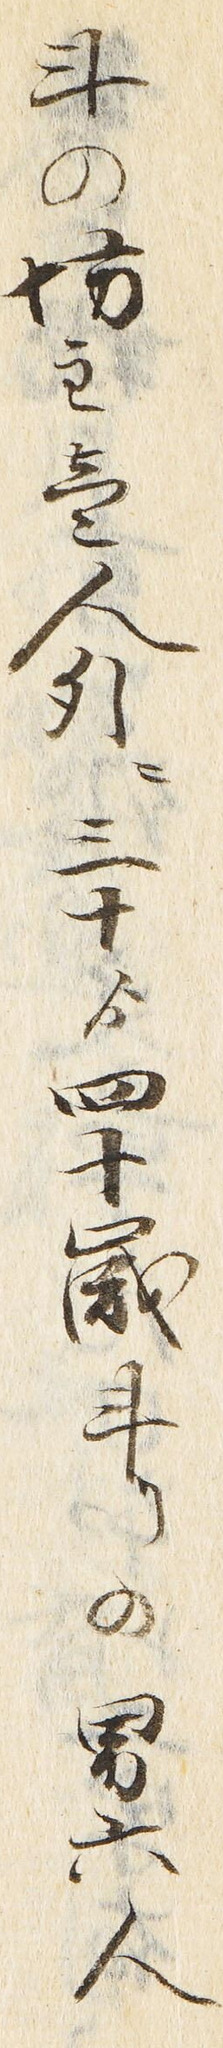計の坊主壱人外三十ゟ四十歳計りの男六人
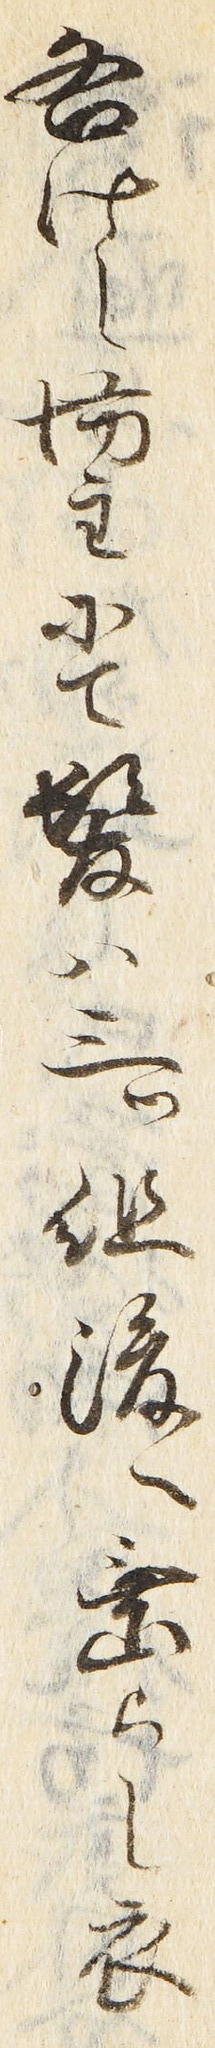各けし坊主にて髪は三っ組後へ垂らし衣
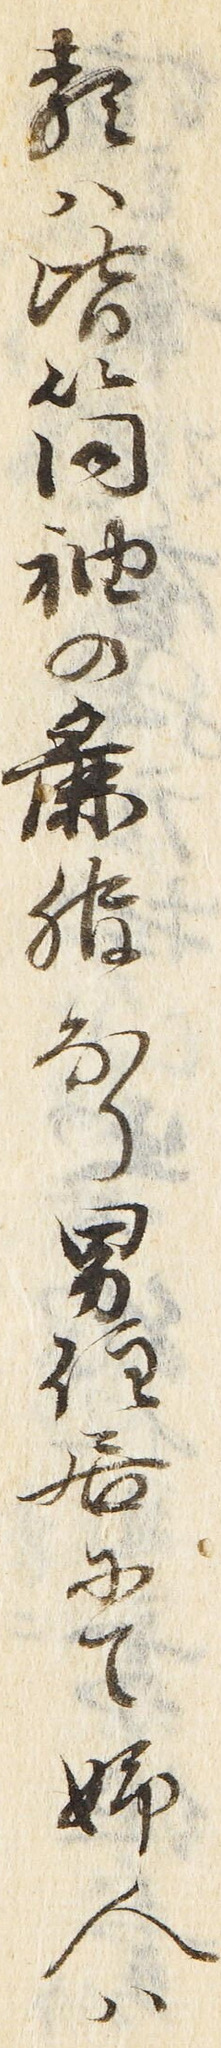類は皆筒袖の麁服なり男住居にて婦人は
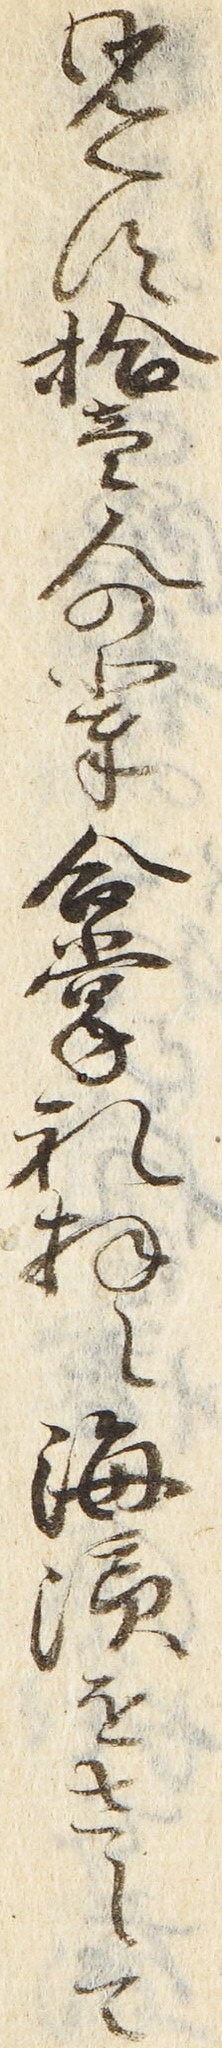見へす拾壱人の輩合掌礼物し海浜をさして

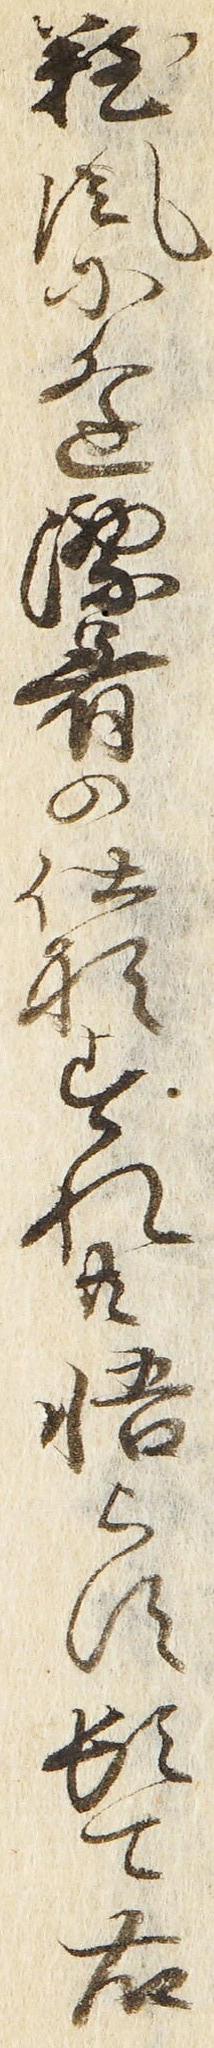難風に逢漂着の仕形すれ共悟らすて右
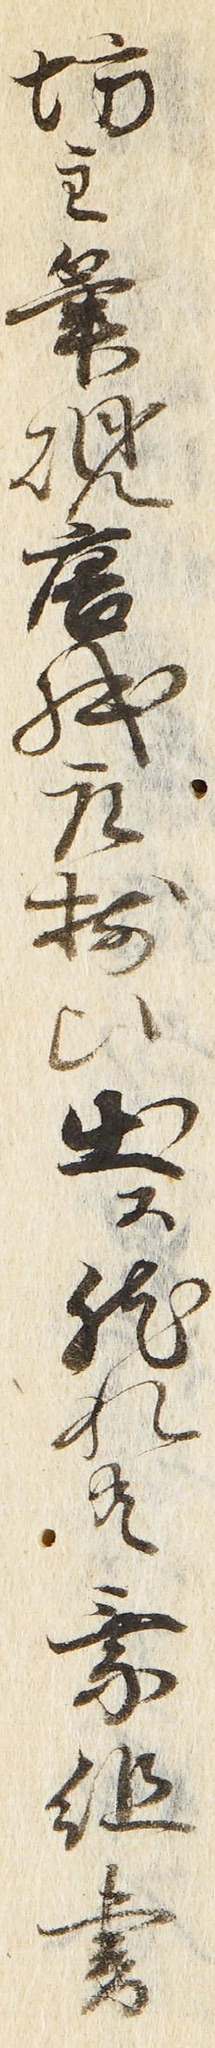坊主筆硯唐紙取ひ出ㇲ然れ共乗組書
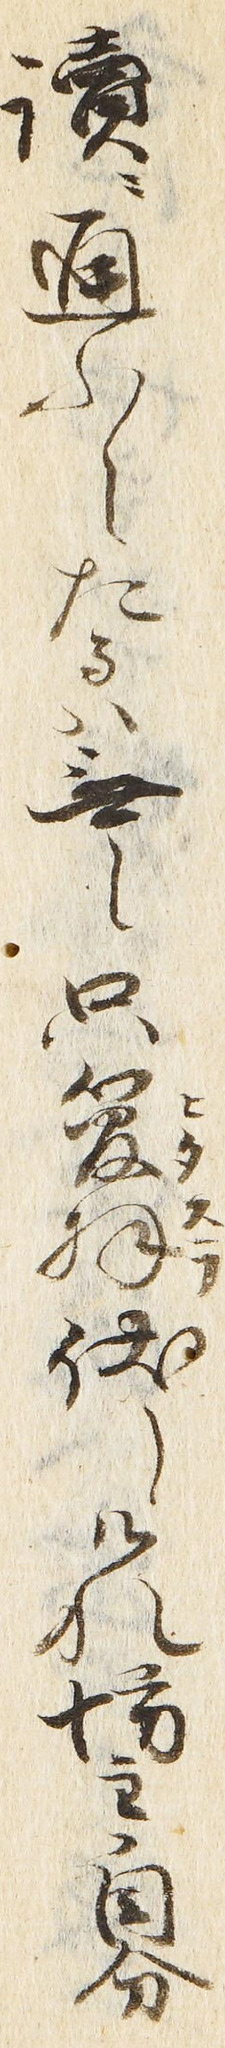読通ふしたるは無し只管拝伏しけれ坊主自分
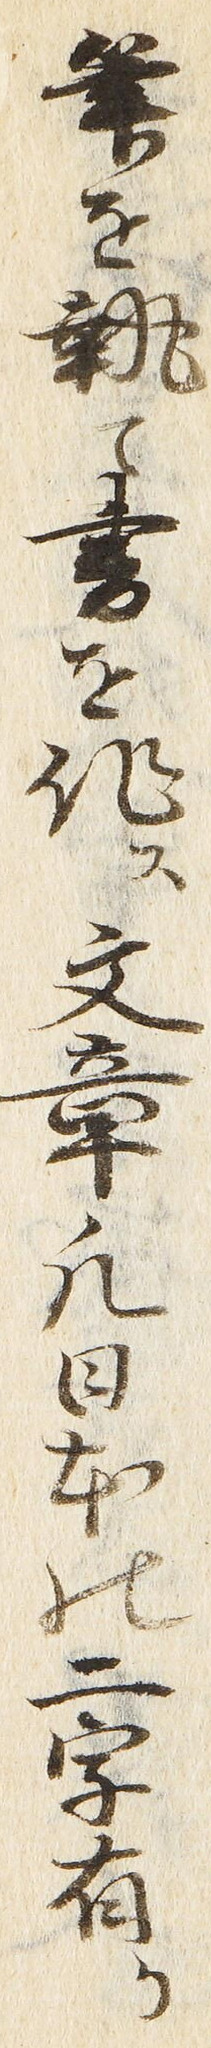筆を執て書を作ㇲ文章凡日本の二字有り
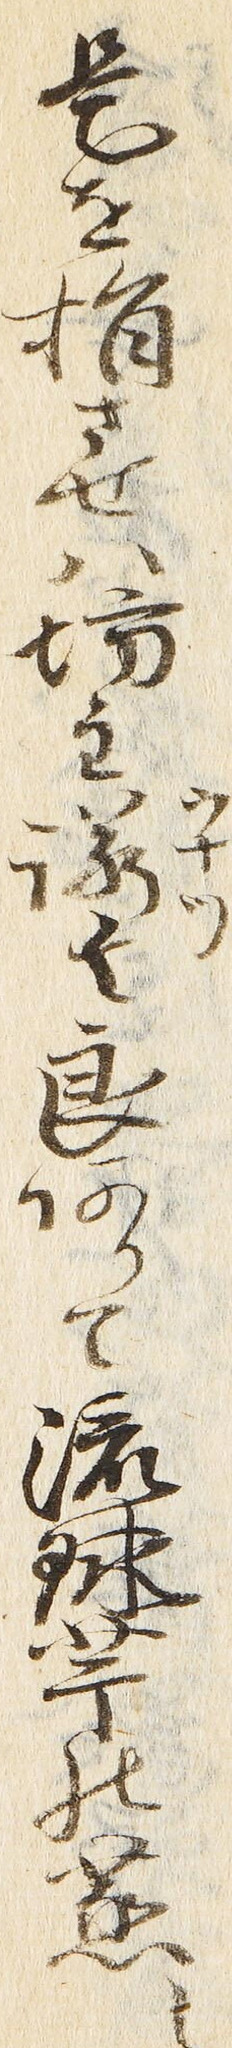是を指させは坊主諾く良ありて琉球芋の蒸し
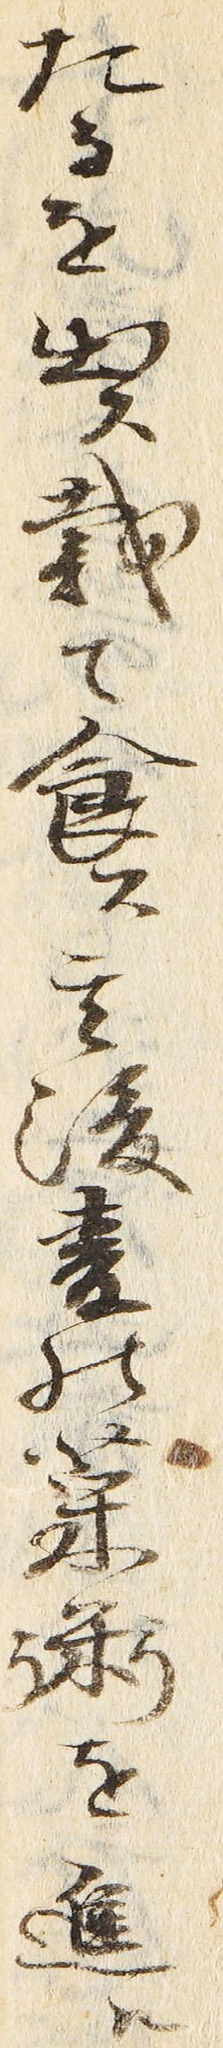たるを出ㇲ載て食ㇲ其後麦の菜粥を進ル
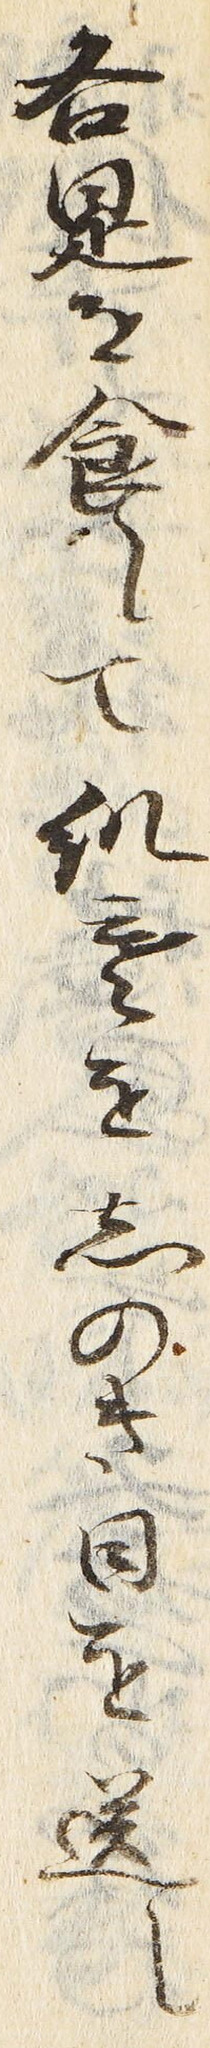各是を食してうえ飢寒をしのき日を送し
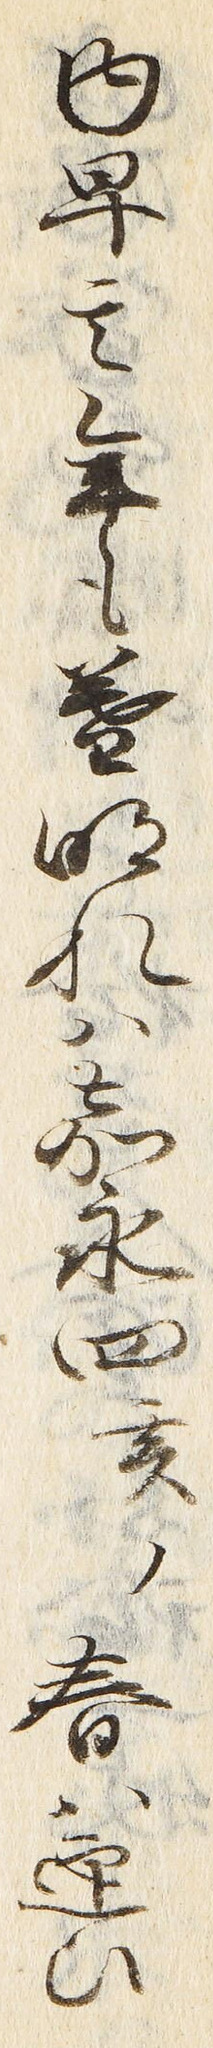内早其年も暮明れは嘉永四亥ノ春は迎ひ
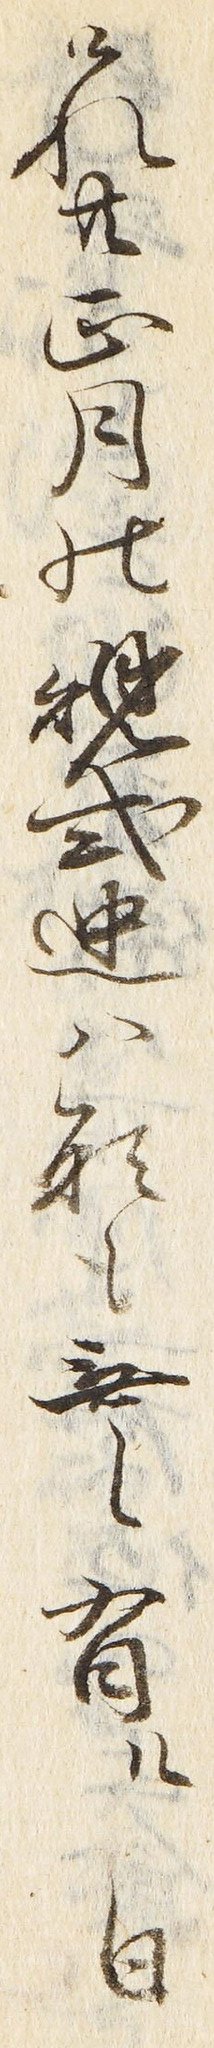けれ共正月の紀式迚は形も無し有ㇽ白
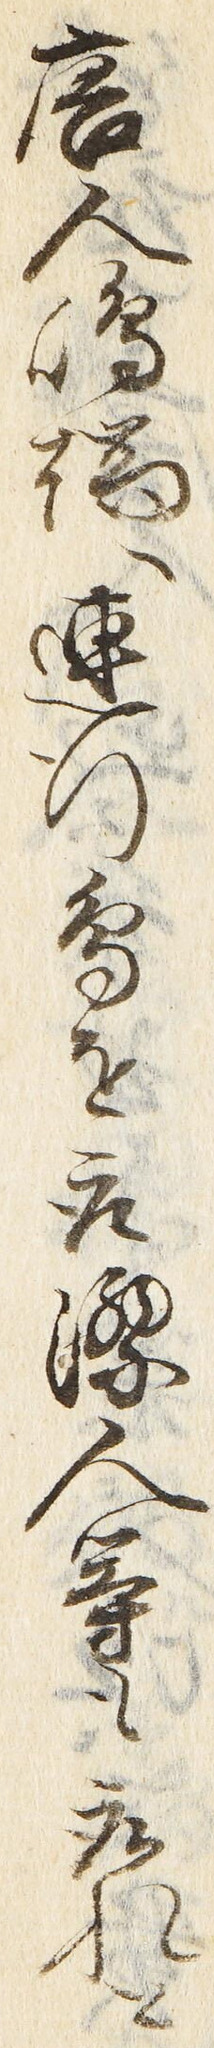唐人島端へ連行鳥を取漂人等も取れと
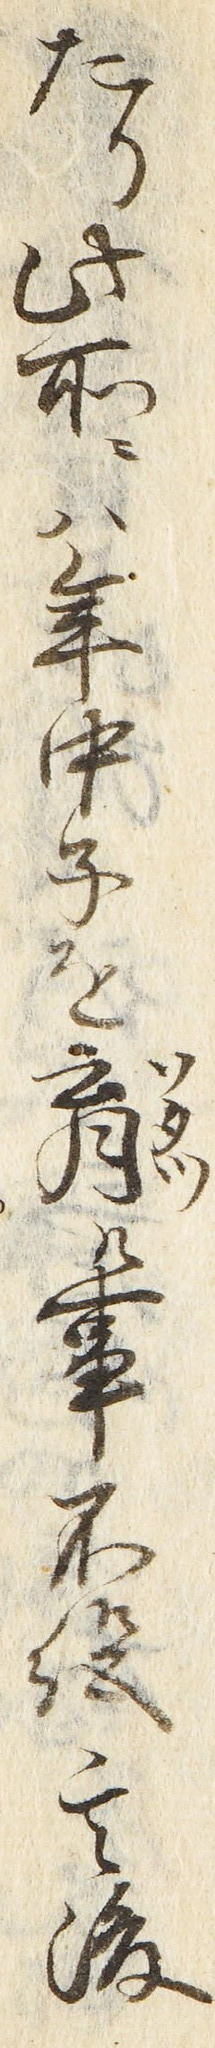たり此所年中子を育ㇽ事不絶其後

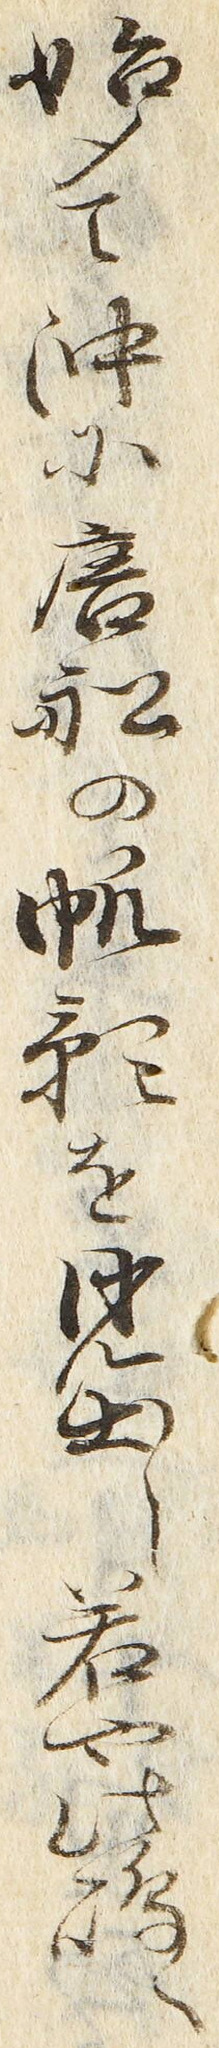始メて沖に唐船の帆影を見出し若しや此島へ
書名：唐物語
